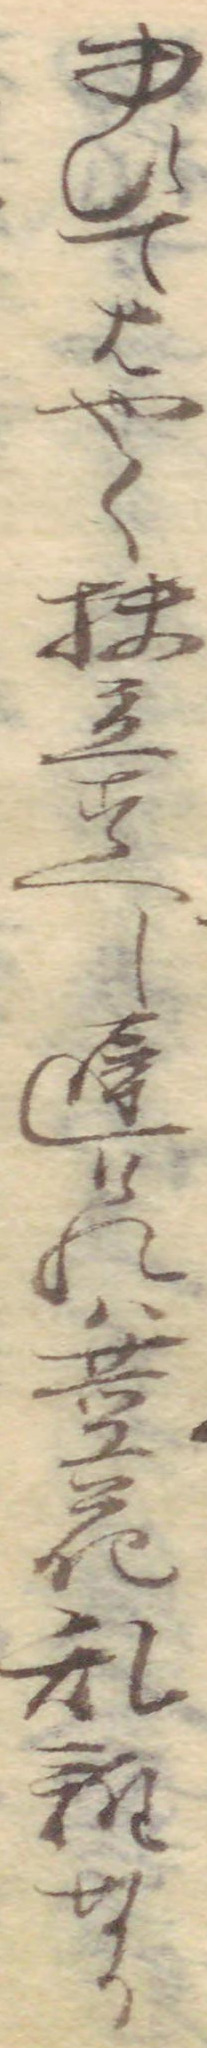ゆひてはやく扶立てすへし遅けれハ茎花乱雑なり
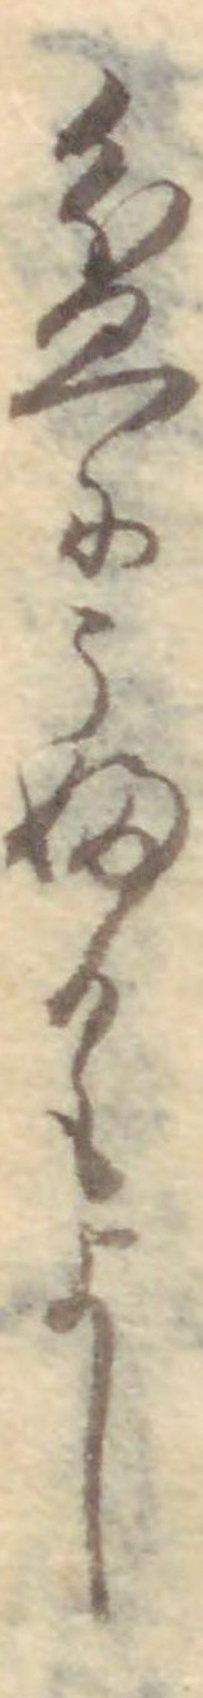盆にうふるもよし

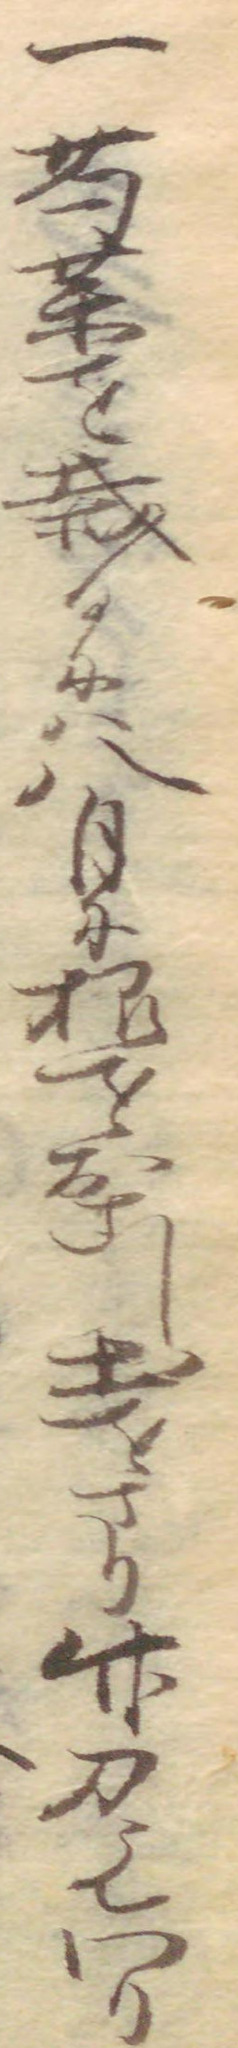一芍薬を植るにハ八月に根をおこし土をさり竹刀二てわり
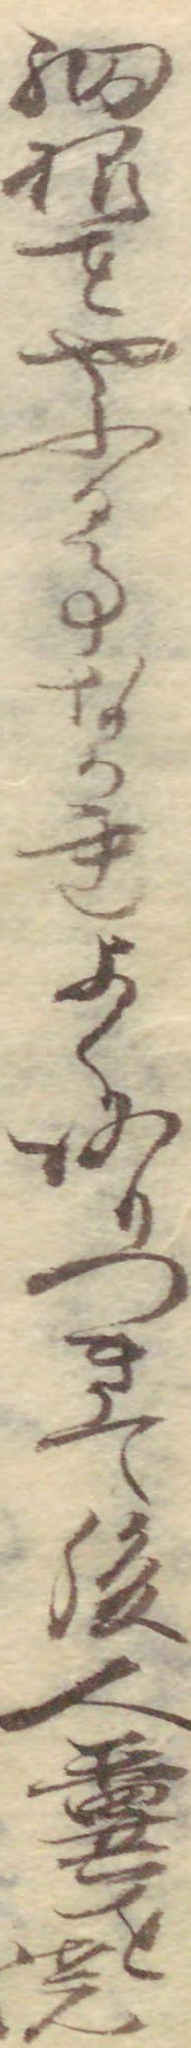細根をやふる事なかれよくありつきて後人糞を澆
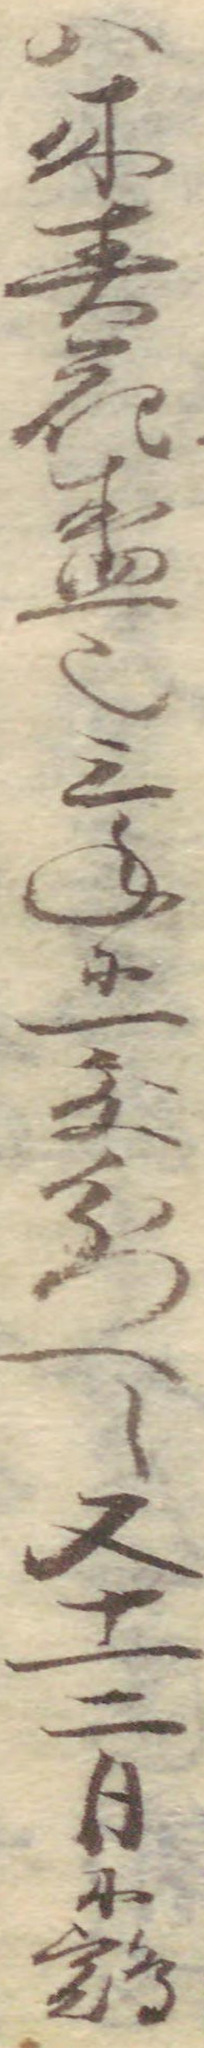ハ来春花盛也三年に一度分つへし又十一ニ月に鶏
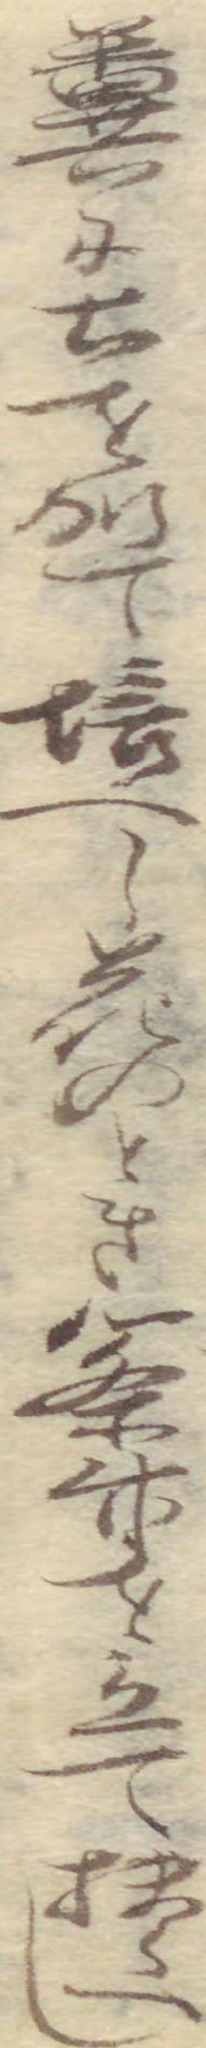糞に土を加て培へし花のとき筿竹を立て扶くへし
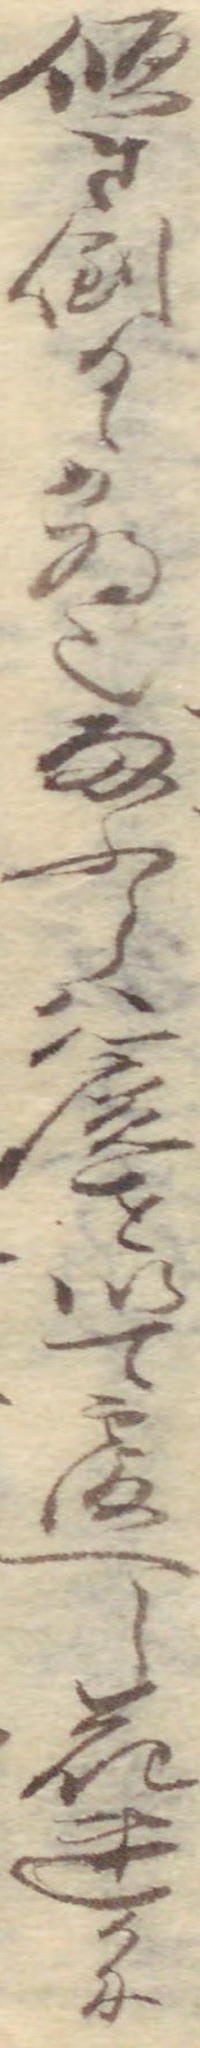傾き倒るゝか為也雨ふらハ簾を以て覆へし花速かに
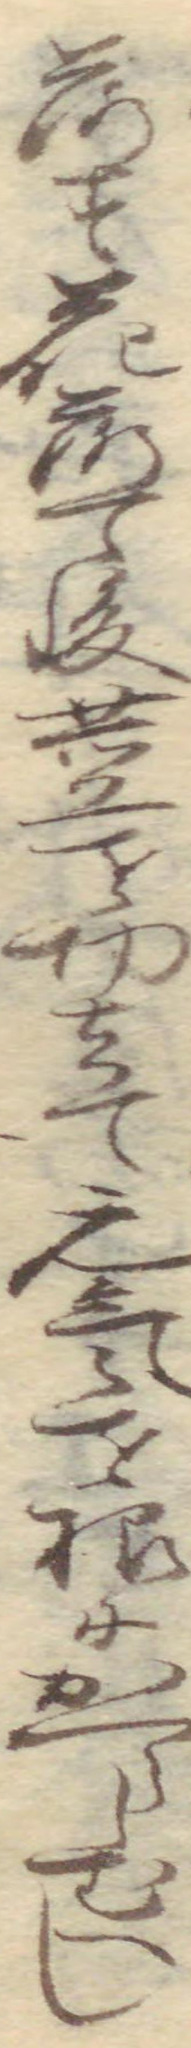落す花落て後茎を切去て元気を根にかへらしむへし
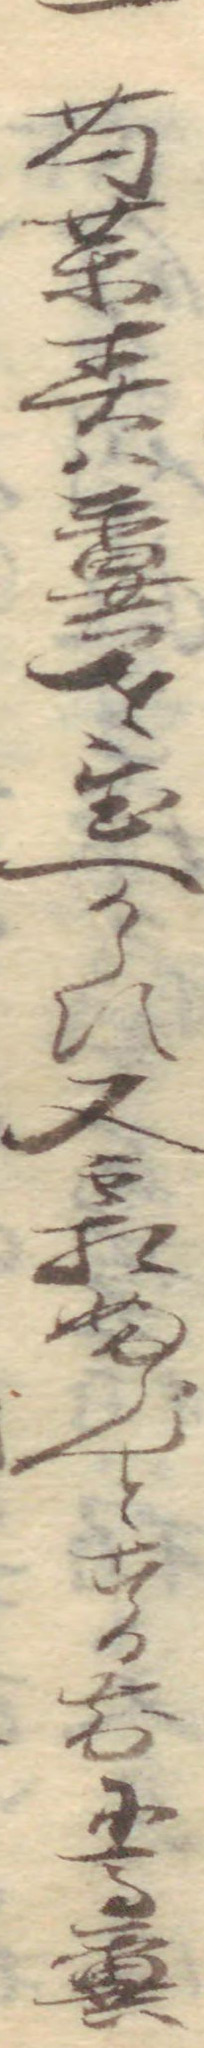一芍薬春は糞を置へからす又霜ふらんとする前にて糞
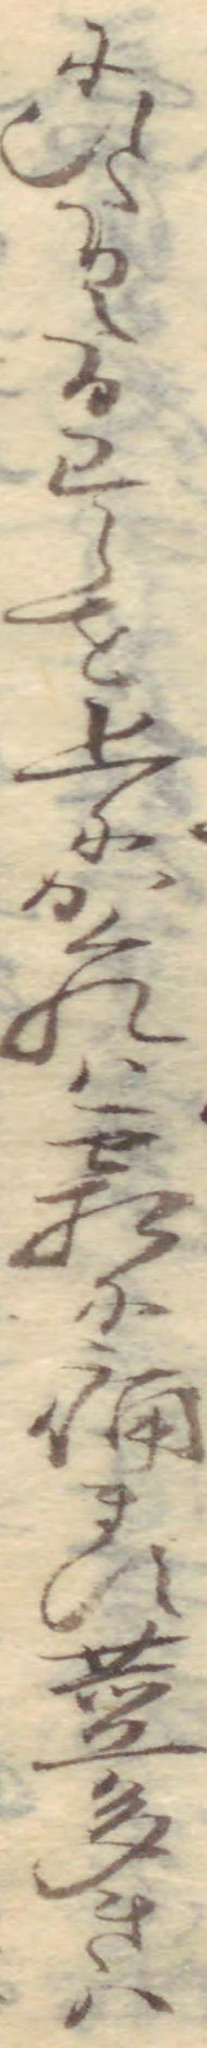にひたりたるわらを上にかくれハ霜に痛ます茎多きハ
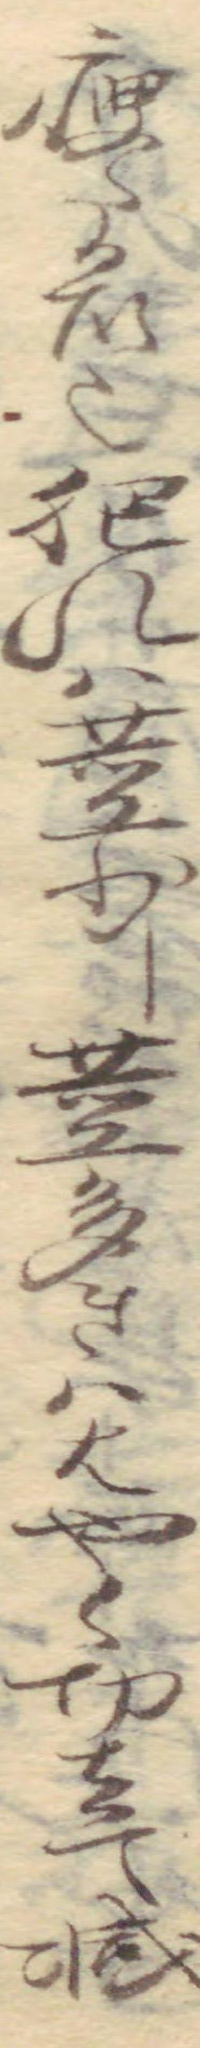痩たる故也肥れハ茎少し茎多きハはやく切去て減
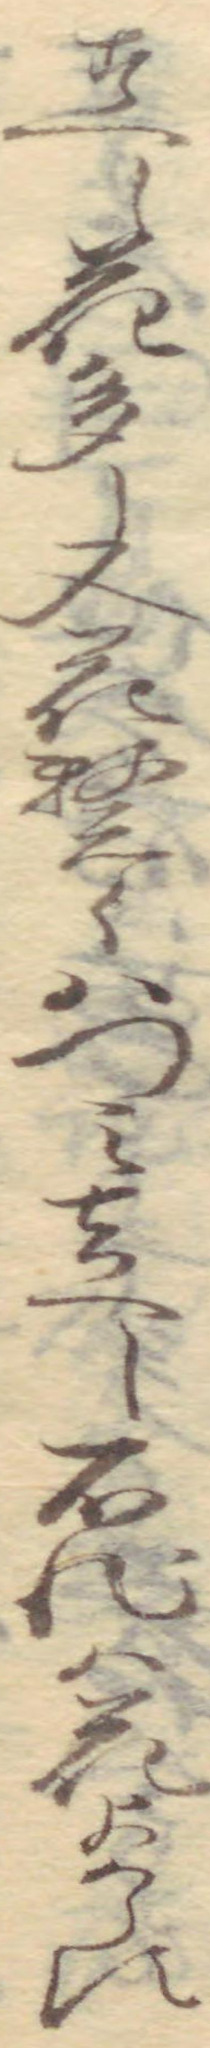すへし花多し又花繁くハつミ去へし不然ハ花よからす
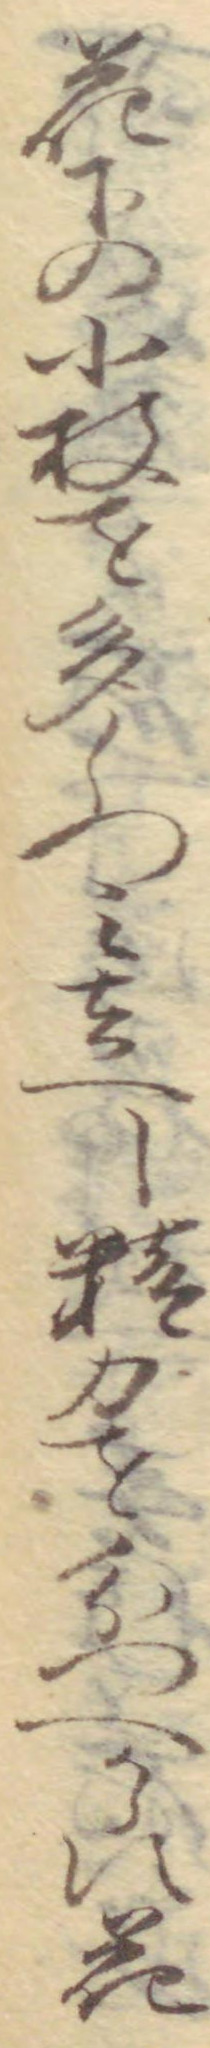花下の小枝を多くつミ去へし精力を分つへからす花
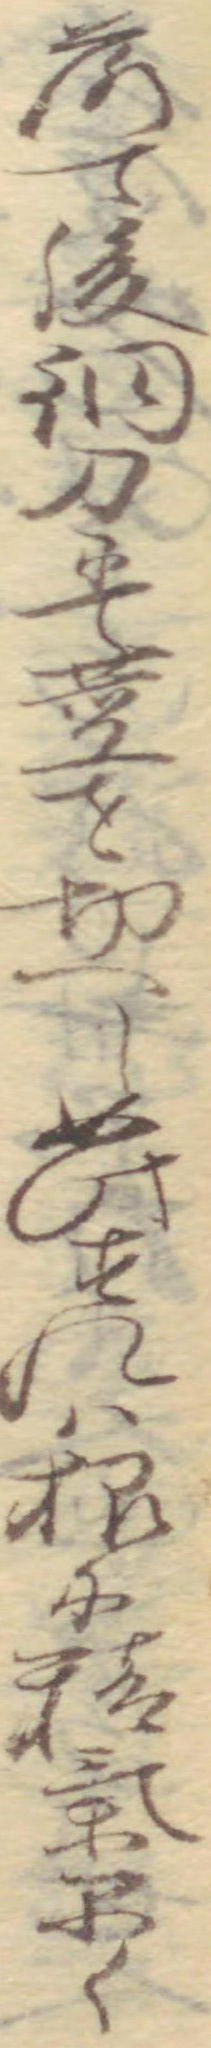落て後細刀にて茎を切へし如此すれハ根に精気早く
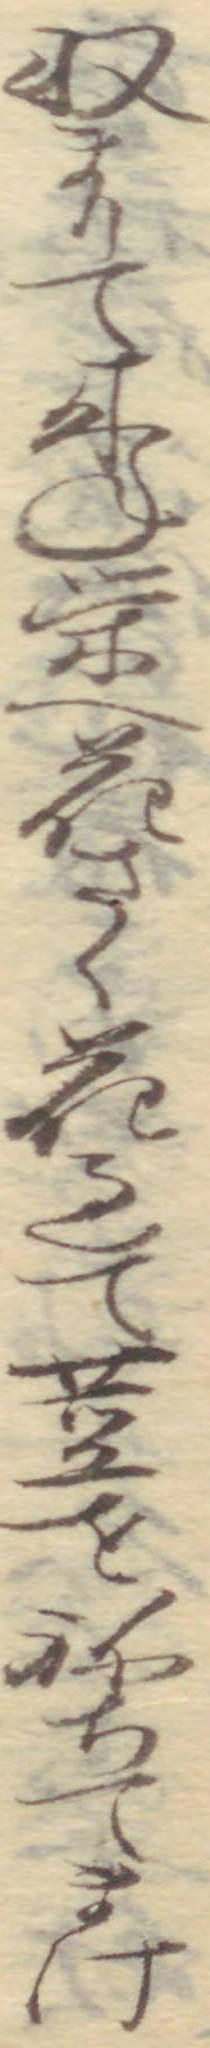収まりて来年栄へ花さく花過て茎をねちてまけ
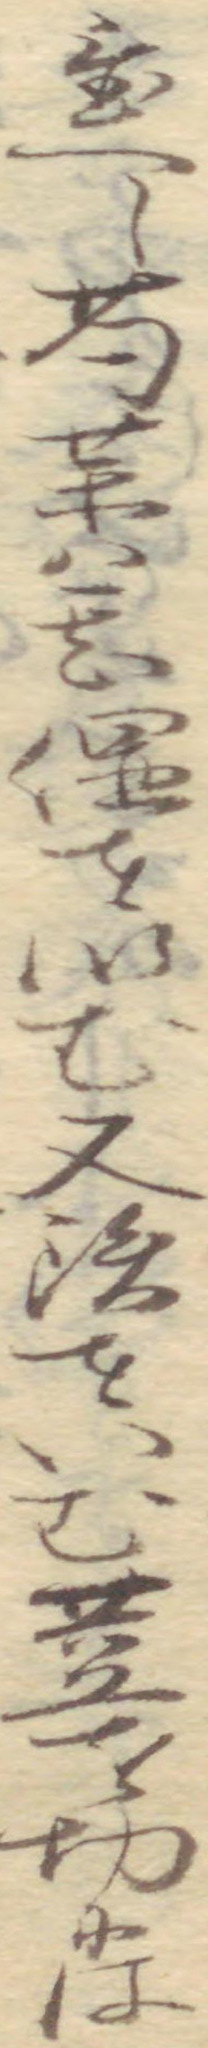置へし芍薬ハ甚湿をいむ又鉄をいむ茎を切には
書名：鶯宿雑記. 巻199-200
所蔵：国立国会図書館 National Diet Library, JAPAN
